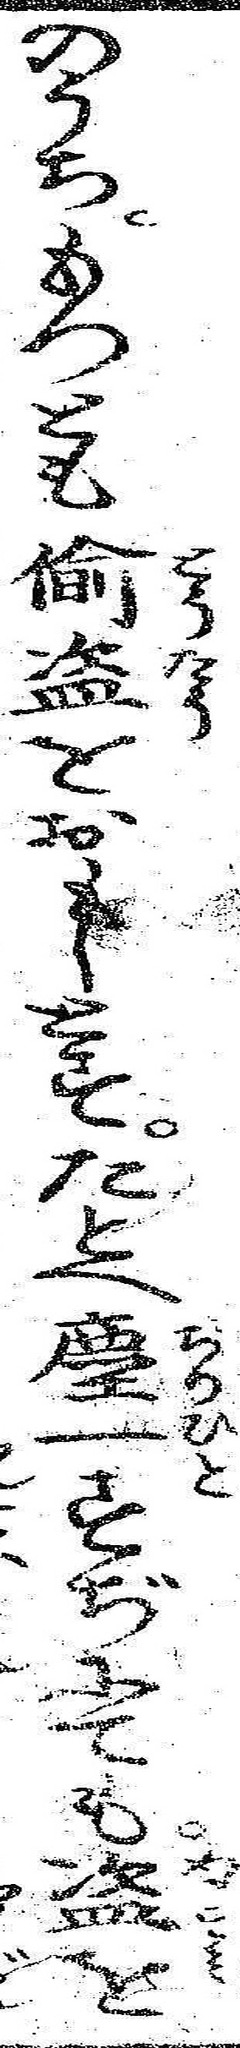のうち。もつとも偸盗をおもしとす。たとへ塵一すぢにても。盗を
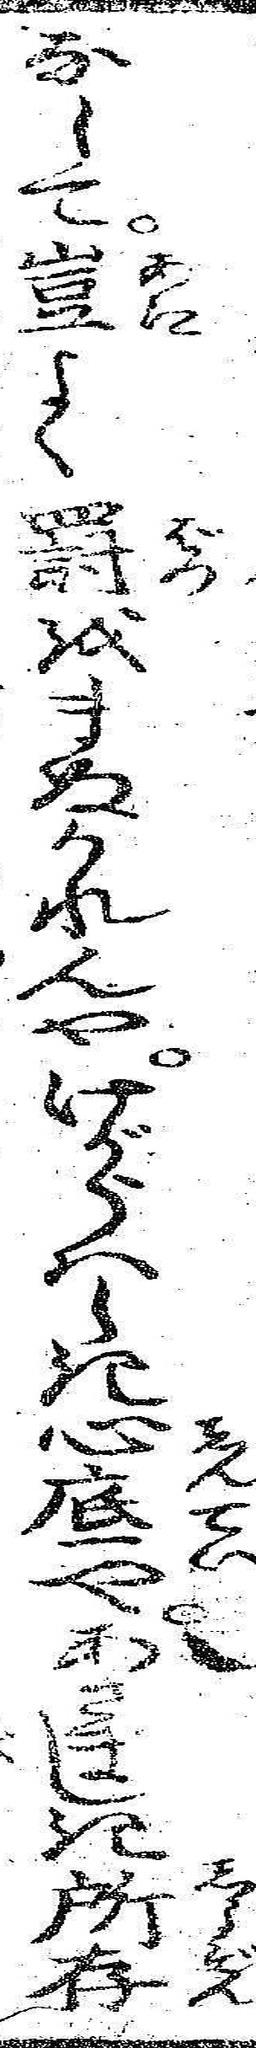なして。豈よく罰をまぬかれんや。けがらはしき心底や。あさましき所存
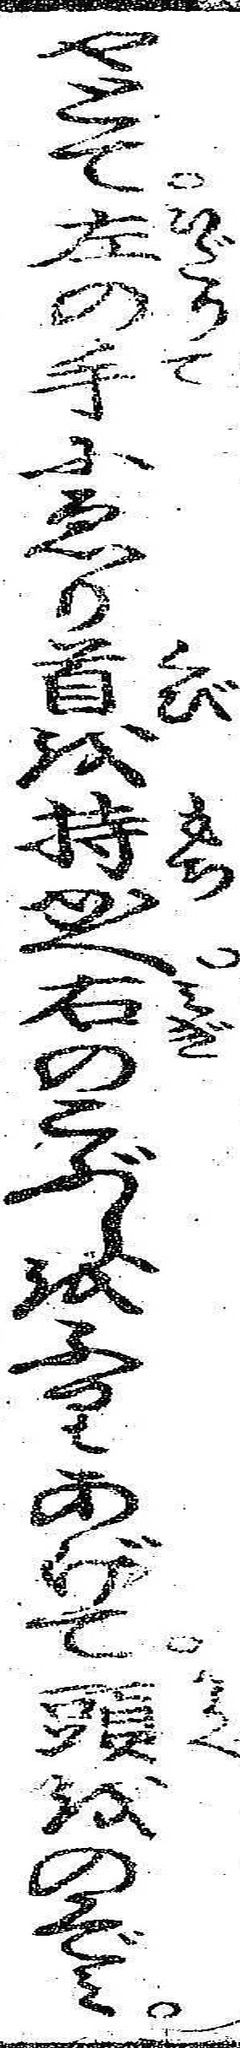やとて。左の手にゑり首を持かへ。右のこぶしをふりあげて。頭をのぞみ。
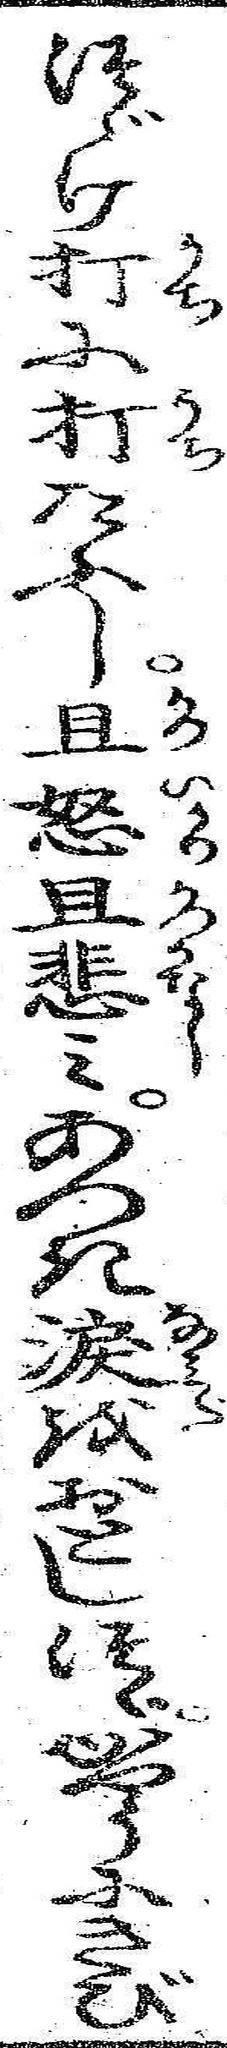つゞけ打に打たふし。且怒且悲み。あつき涙をおとしつゝ。かやうにきび
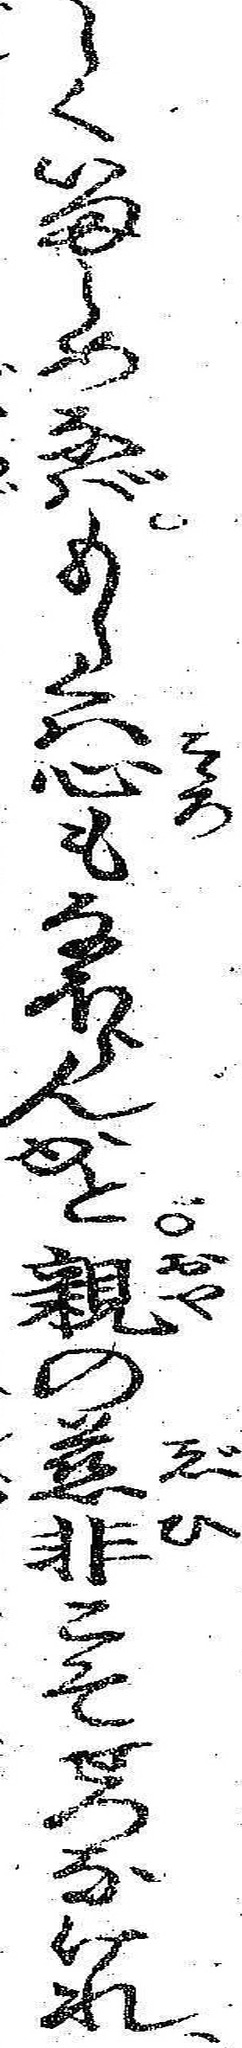しくいましめなば。もしくは心もなほらんかと。親の慈非こそせつなけれ。
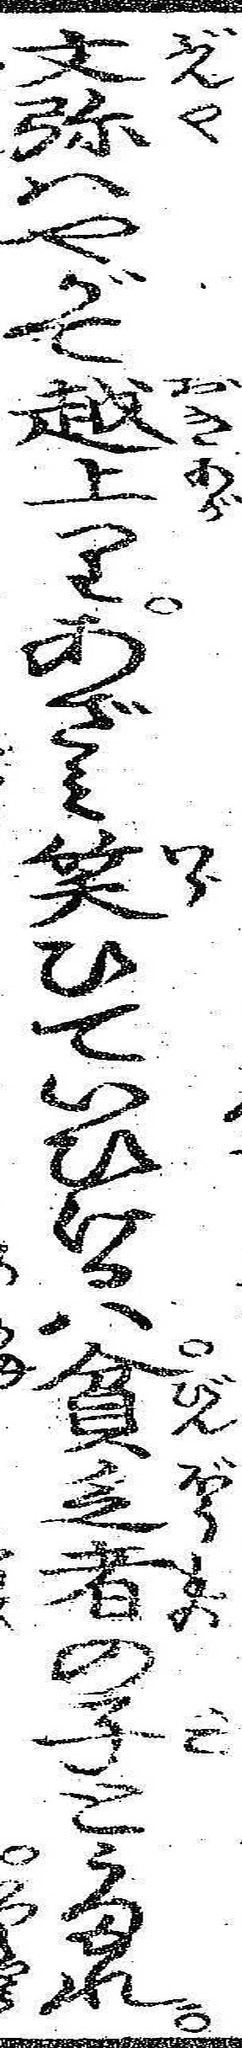文弥はやがて越上り。あざみ笑ひていひけるは。貧乏者の子とうまれ。
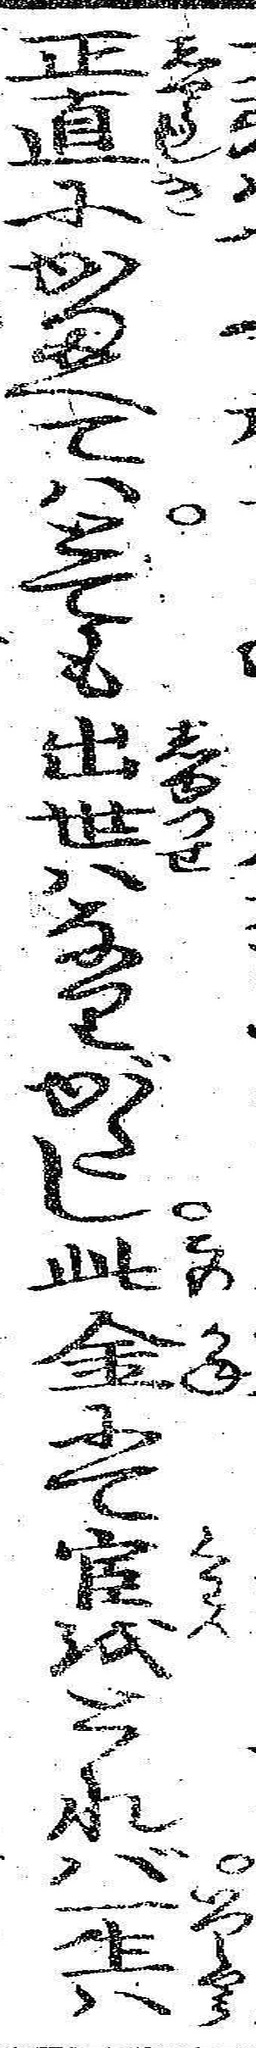正直にかまへては。とても出世はなりがたし。此金にて官をとれば。一生は
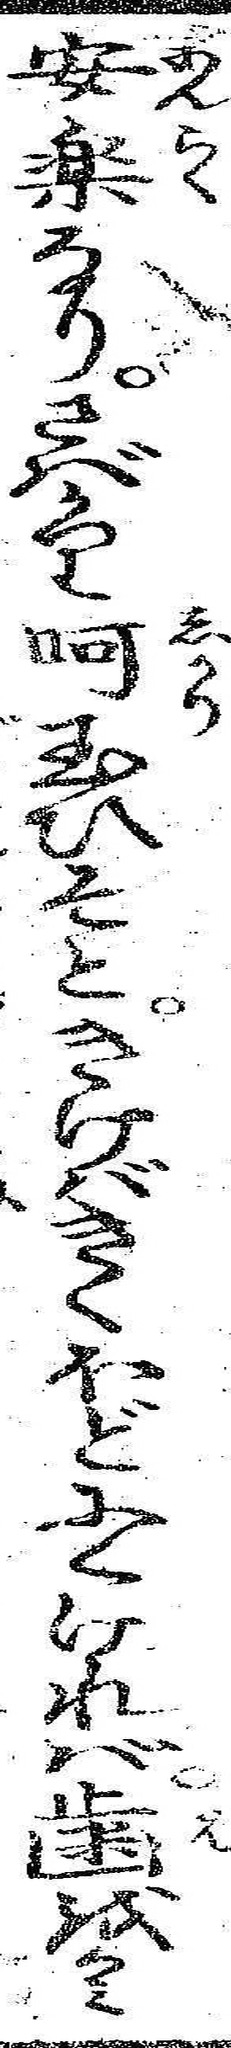安楽なり。さばかり呵玉ひそと。きけばきくほどにくければ。歯をかみ
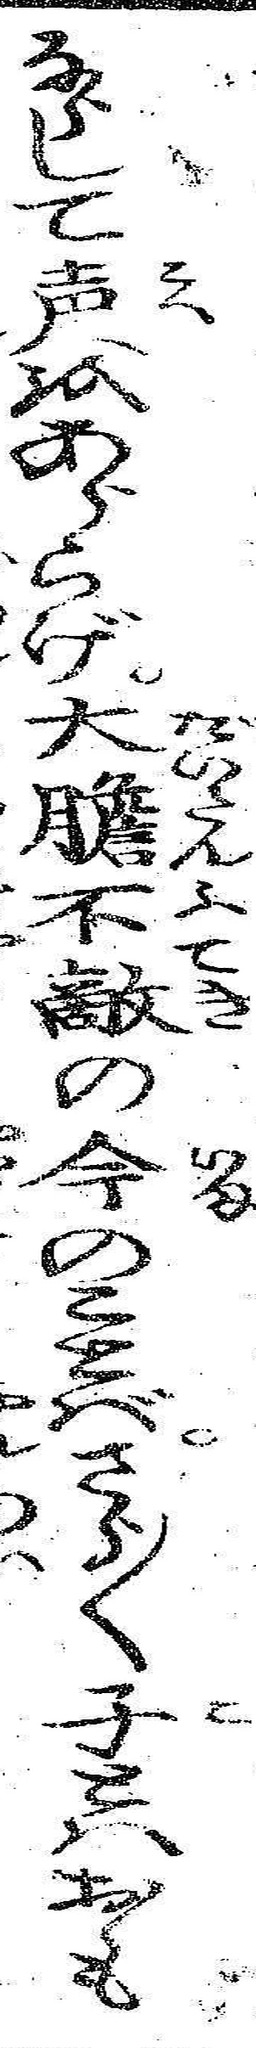ならして声をあららげ。大胆不敵の今のことば。さら〳〵子とはおも
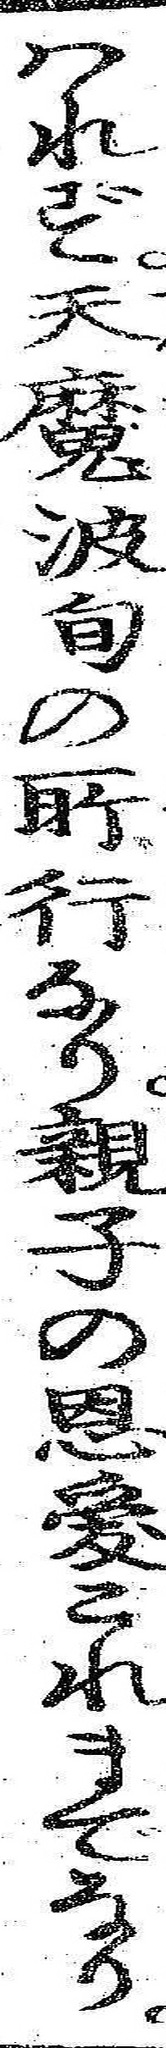はれず。天魔波旬の所行なり。親子の恩愛これまでなり。
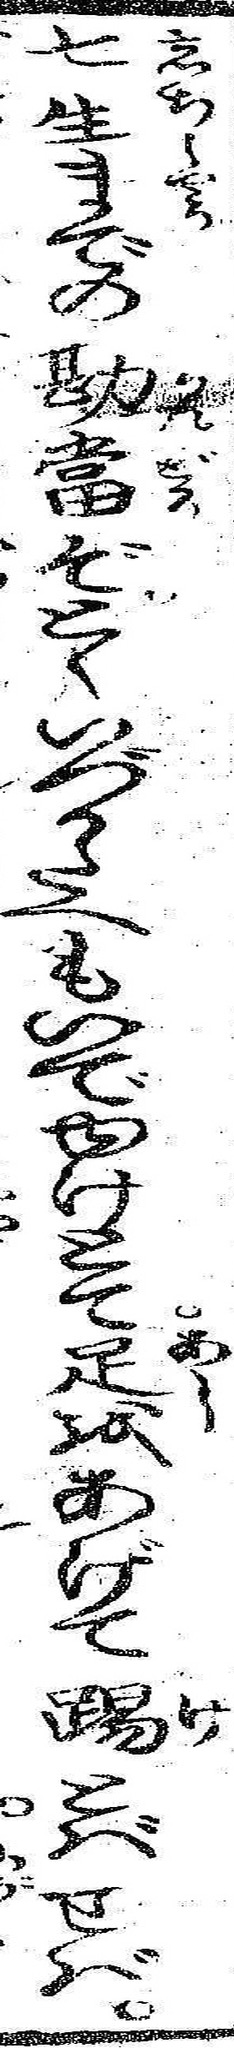七生までの勘当ぞ。とくいづかたへもいでゆけとて。足をあげて踢とばせば。
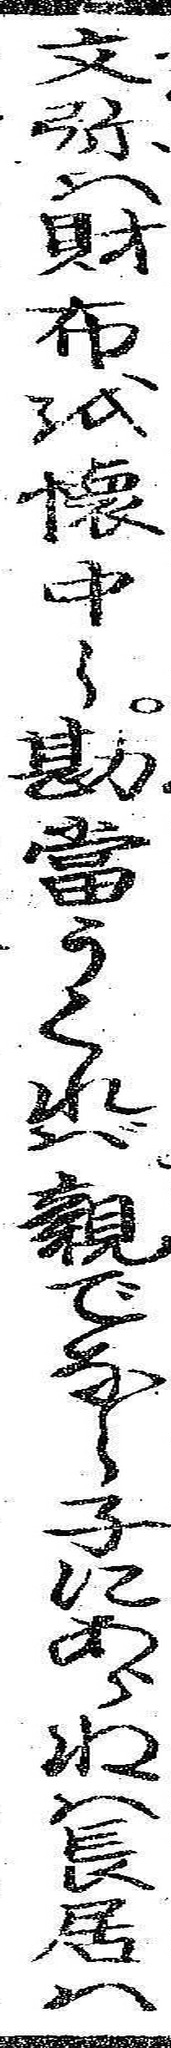文弥は財布を懐中し。勘当うくれば。親でなし子にあらねば。長居は
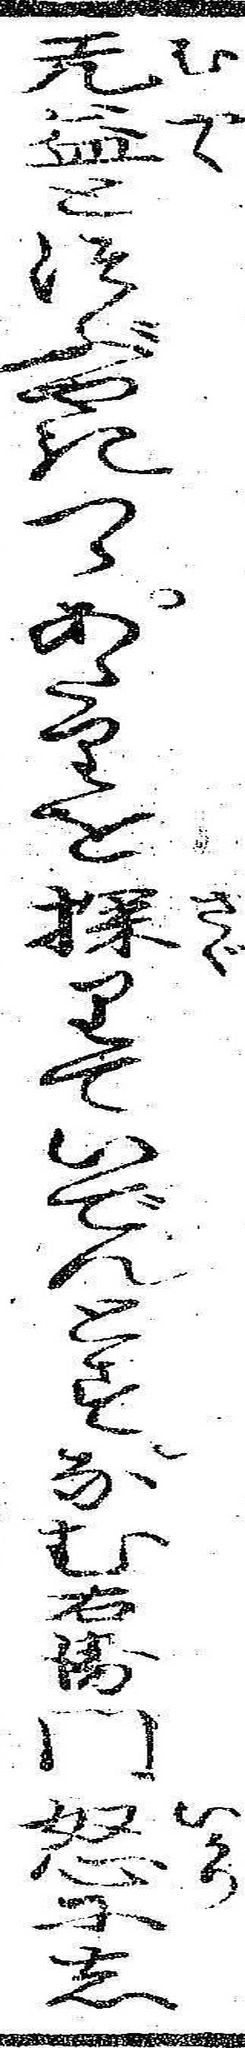無益とつぶやきつゝ。あたりを探りていでんとす。なむ右衛門怒にし
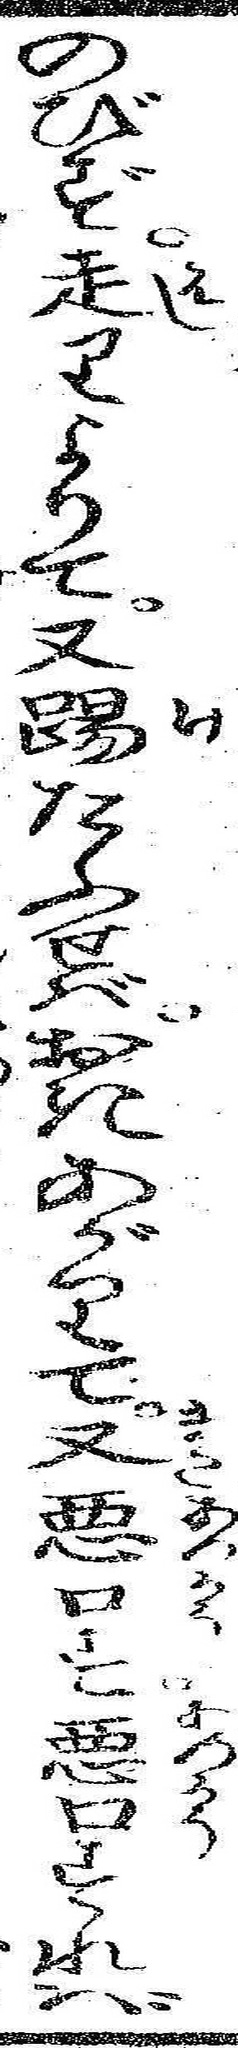のびず。走りよりて。又踢たふせば。おきあがりて。又悪口す。悪口すれば
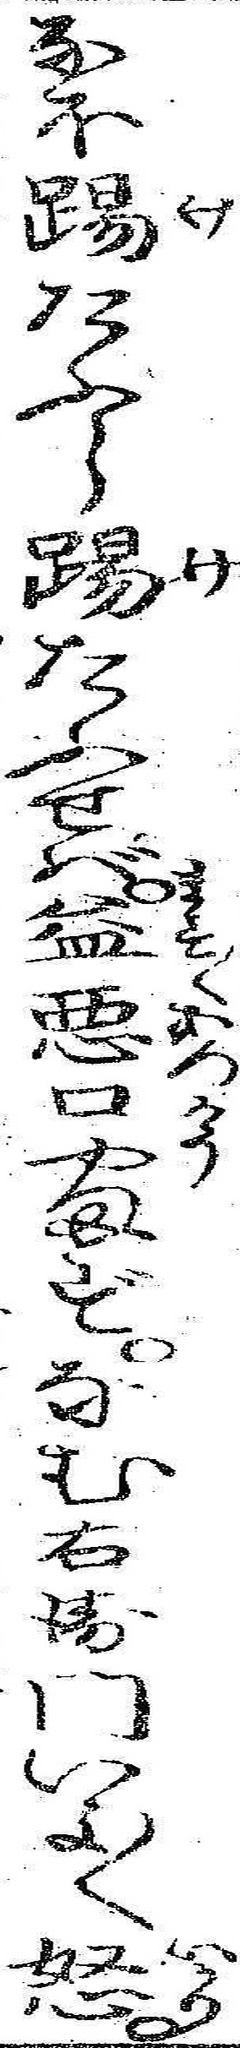なほ踢たふし踢たふせば。益悪口やまず。なむ右衛門いよ〳〵怒。
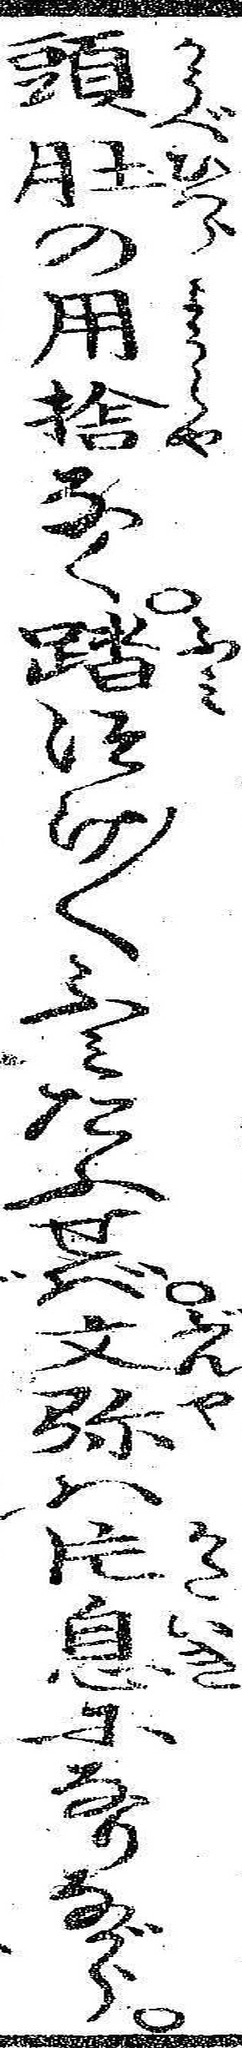頭肚の用捨なく。踏つけ〳〵ふみたふせば。文弥は片息になりながら。
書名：昔話稲妻表紙
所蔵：国文学研究資料館
